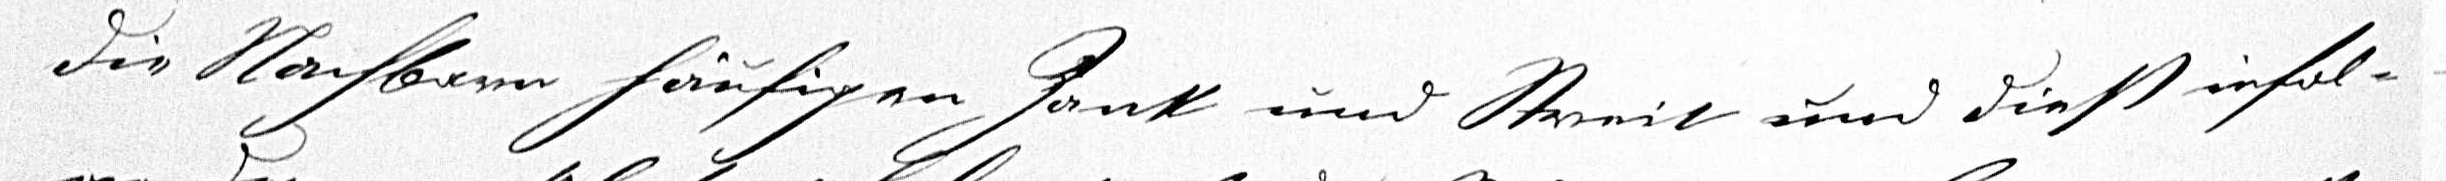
die Nachbaren häufigen Zank und Streit und dieß infol¬
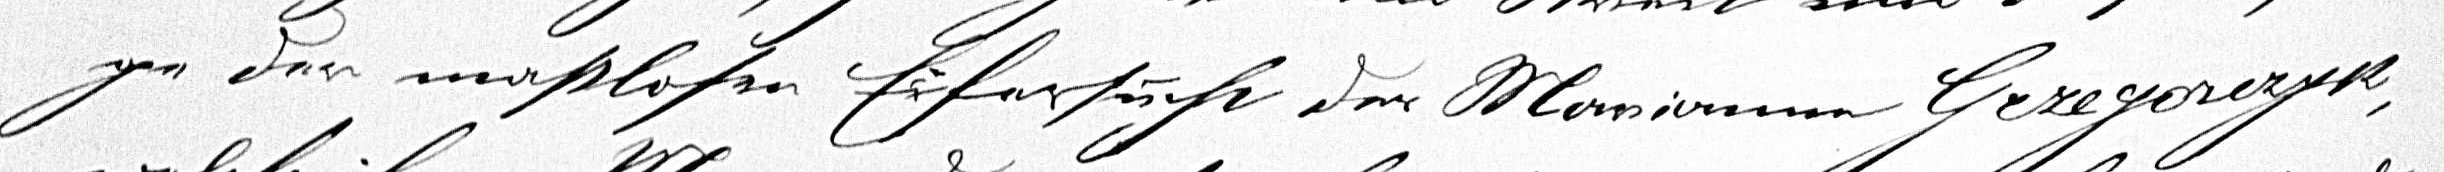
ge der maßlosen Eifersucht der Marianne Grzegorczyk,
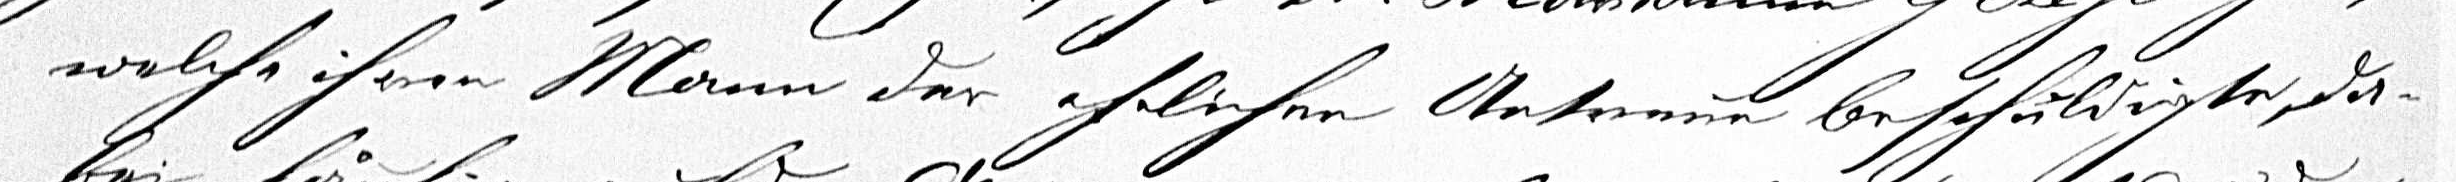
welche ihren Mann der ehelichen Untreue beschuldigte, da¬
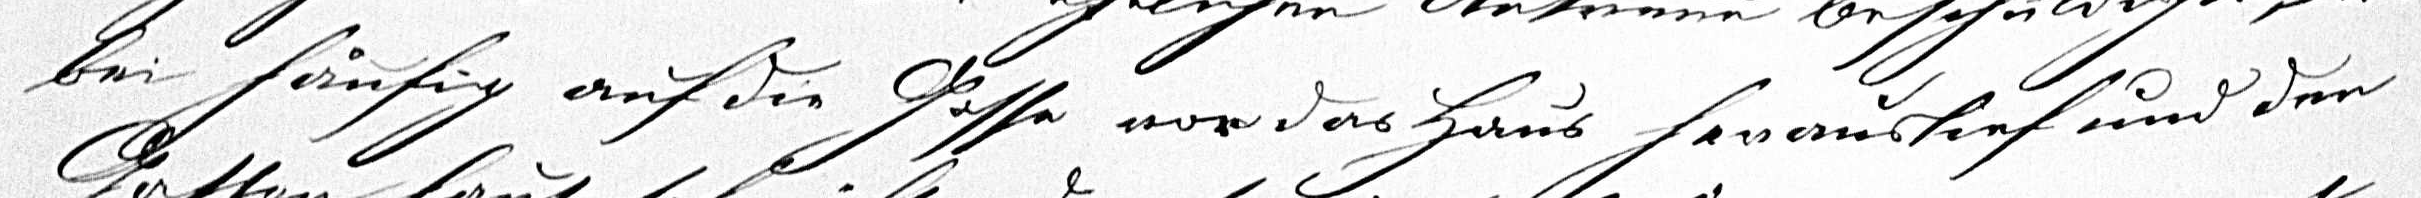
bei häufig auf die Gasse vor das Haus herauslief und der
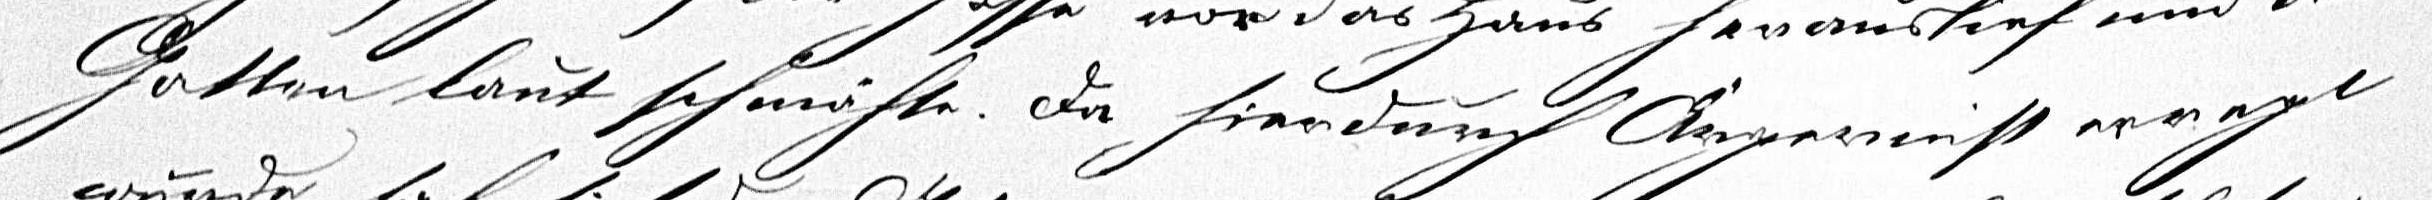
Gatten laut schmähte. Da hierdurch Ärgerniß erregt
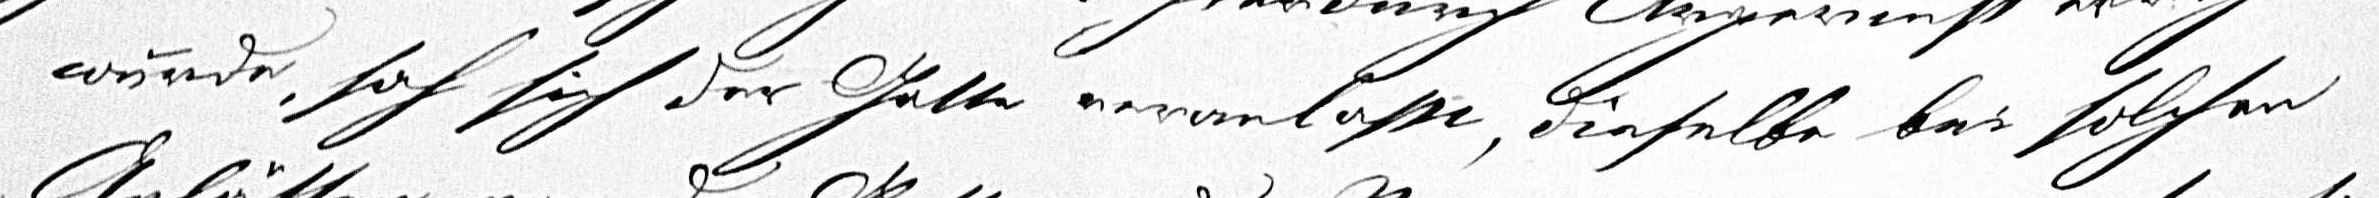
wurde, sah sich der Gatte veranlaßt, dieselbe bei solchen
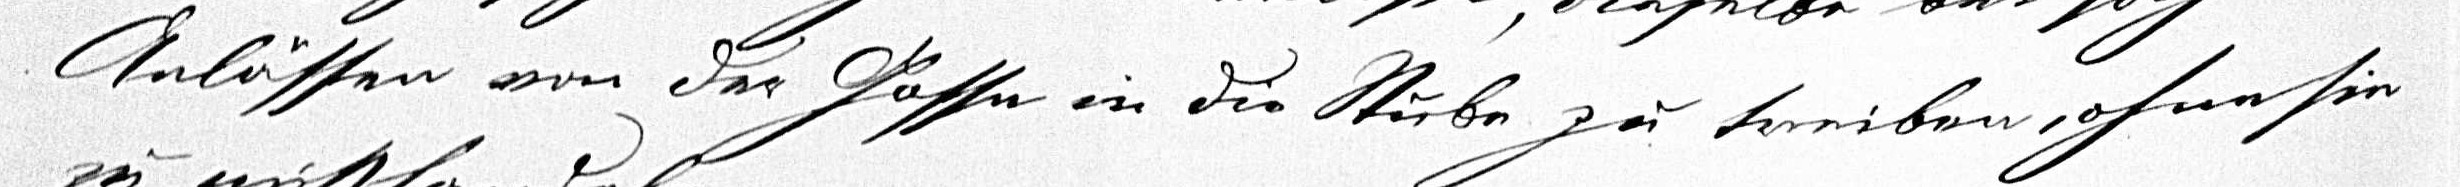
Anlässen von der Gasse in die Stube zu treiben, ohne sie
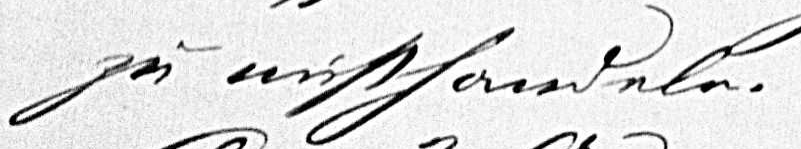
zu mißhandeln.
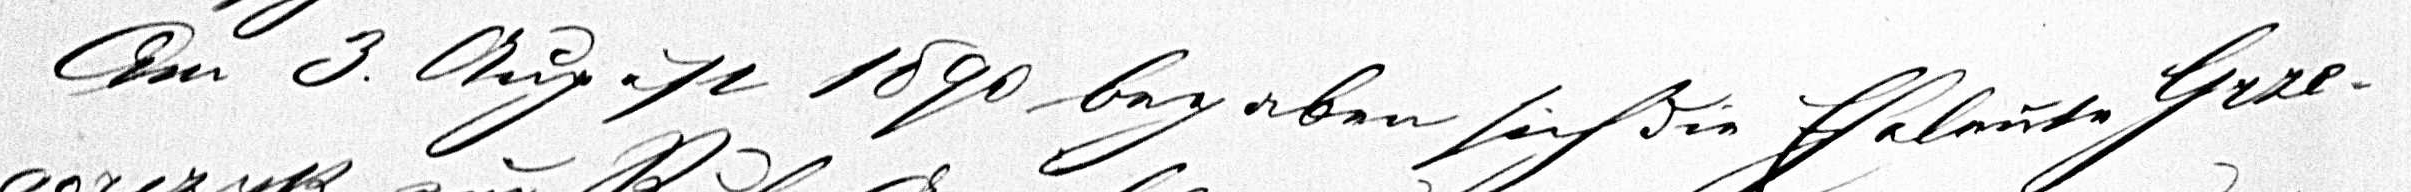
Am 3. August 1890 begaben sich die Eheleute Grze¬
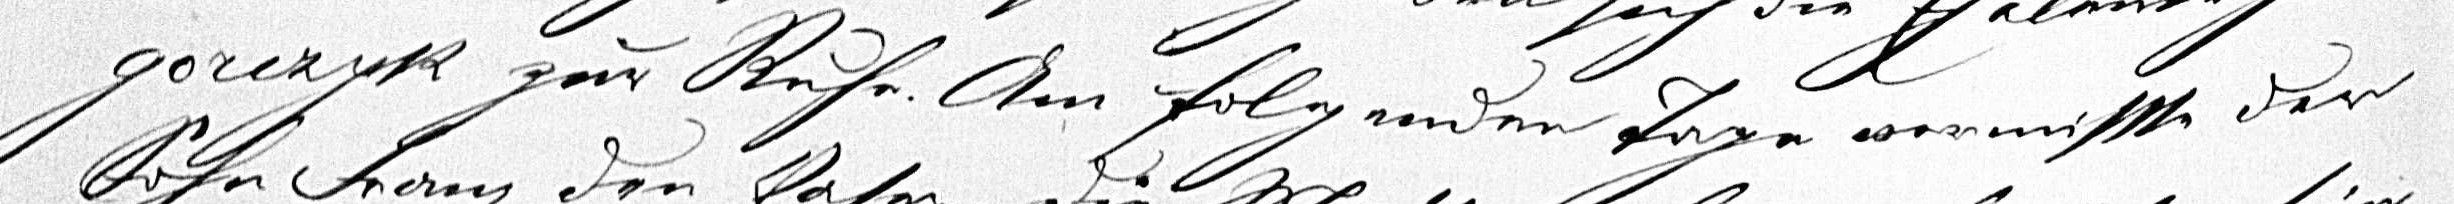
gorczyk zur Ruhe. Am Folgenden Tage vermisste der
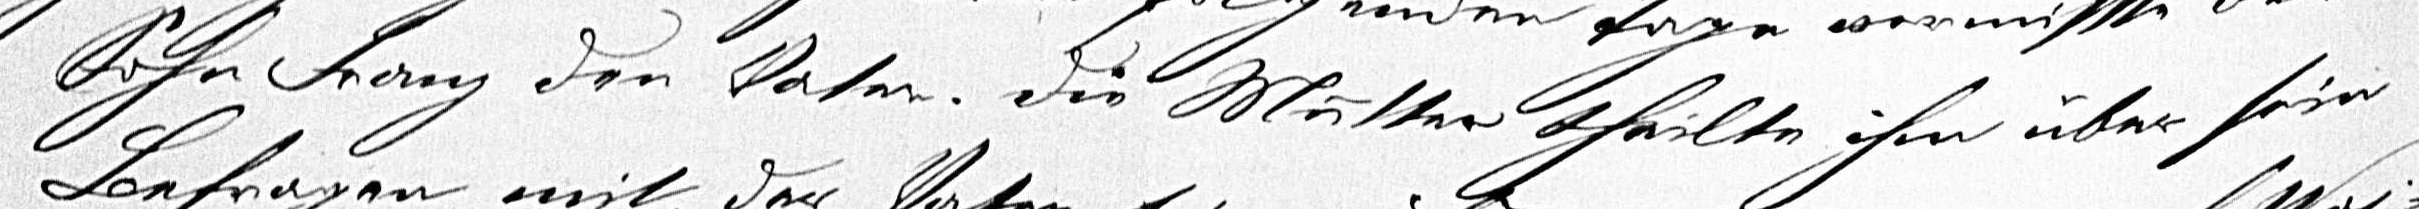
Sohn Franz den Vater. Die Mutter theilte ihm über sein
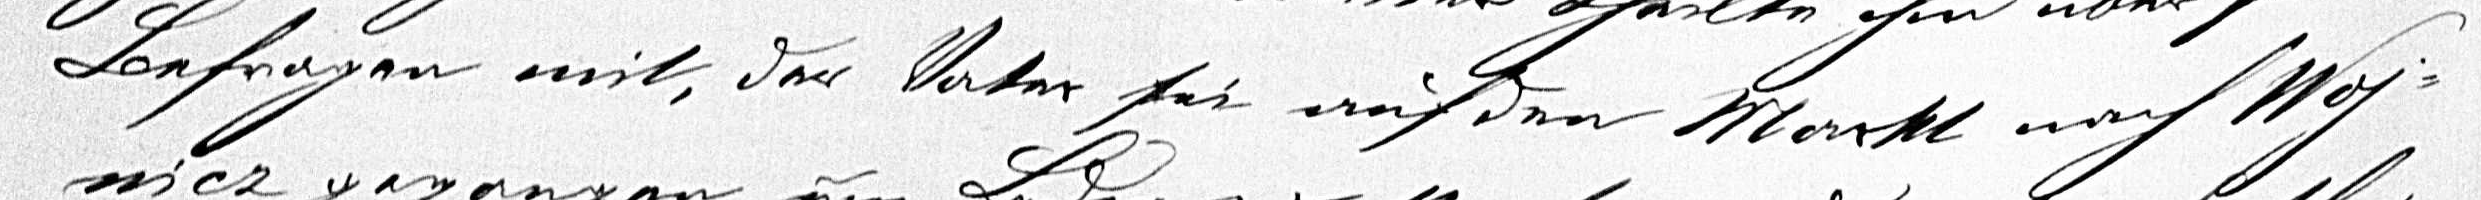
Befragen mit, der Vater sei auf den Markt nach Woj¬
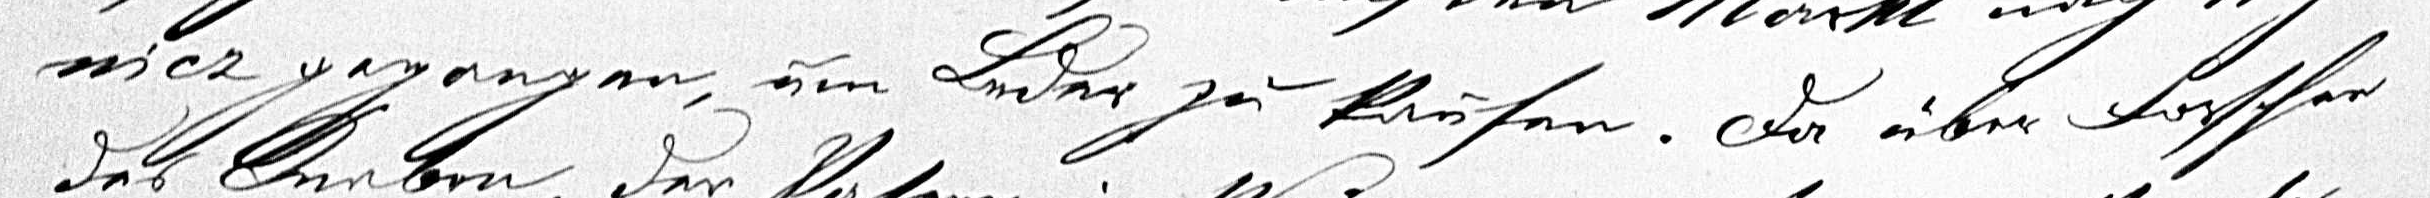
nicz gegangen, um Leder zu kaufen. Da über forschen
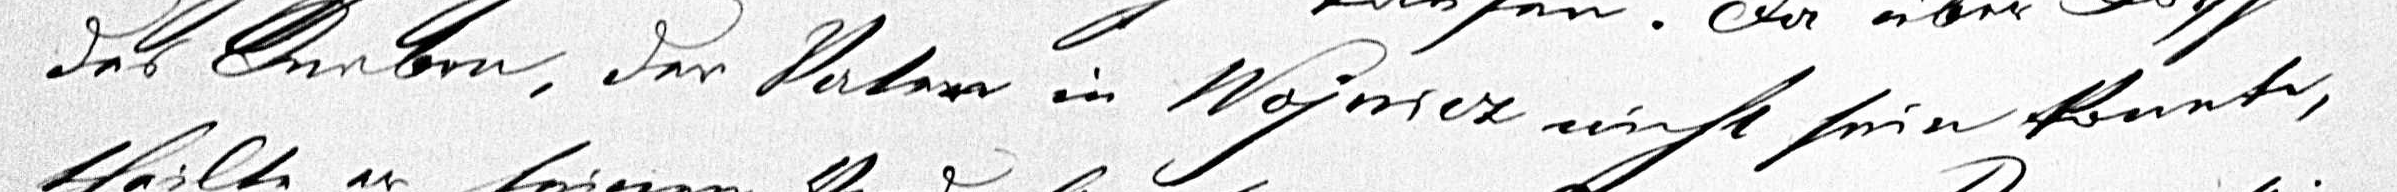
des Knaben, der Vater in Wojnicz nicht sein konnte,
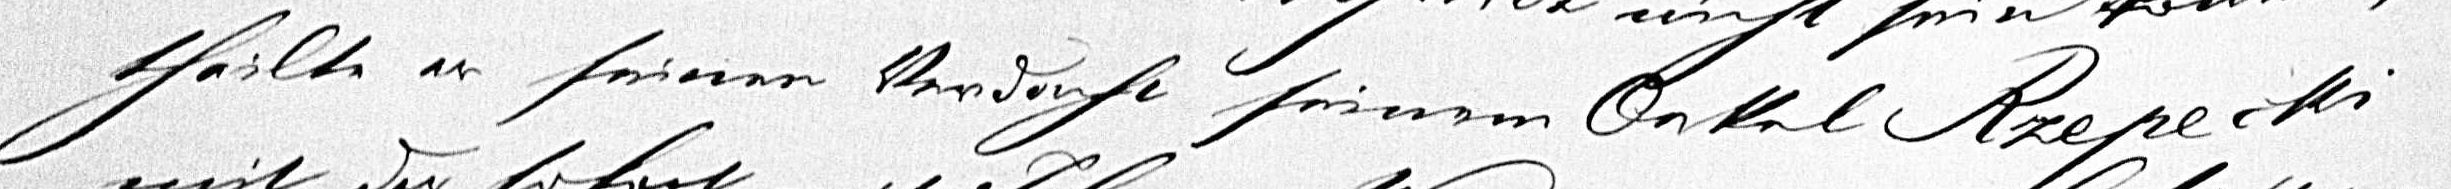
theilte er seinen Verdacht seinen Onkel Rzepecki
